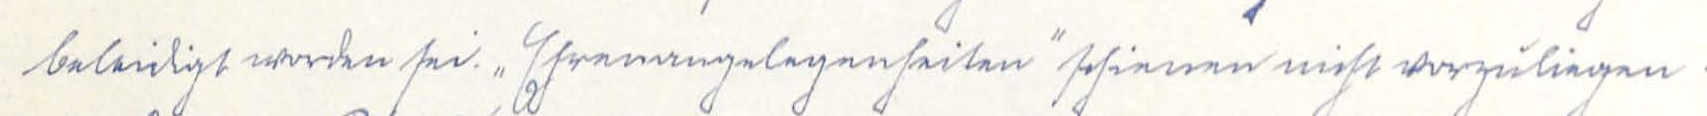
beleidigt worden sei. "Ehrangelegenheiten" schienen nicht vorzuliegen.
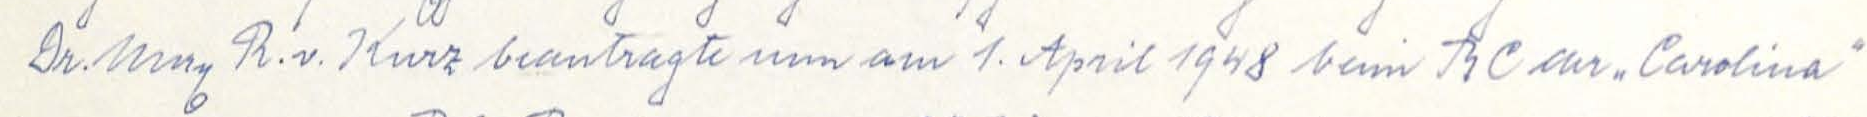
Dr. Max R. von Kurz beantragte nun am 1. April 1948 beim BC der "Carolina"
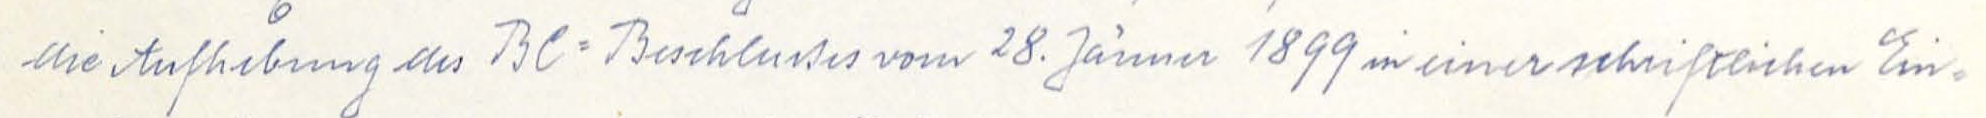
die Aufhebung des BC-Beschlusses vom 28. Jänner 1899 in einer schriftlichen Ein-
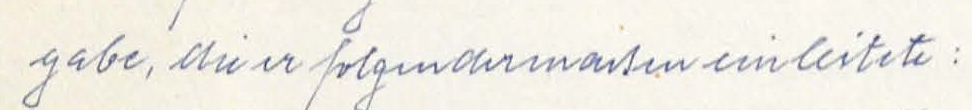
gabe, die er folgendermaßen einleitete:
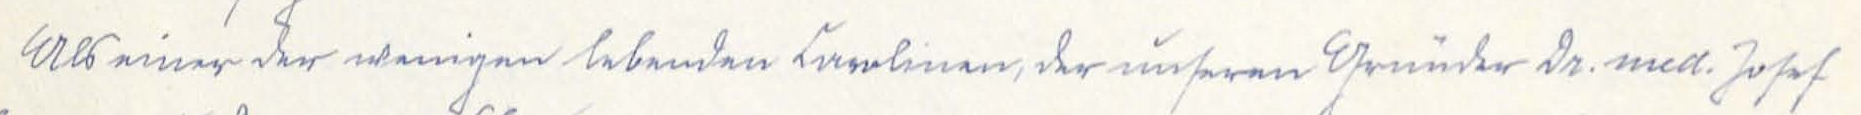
Als einer der wenigen lebenden Carolinen, die unseren Gründer Dr. med. Josef
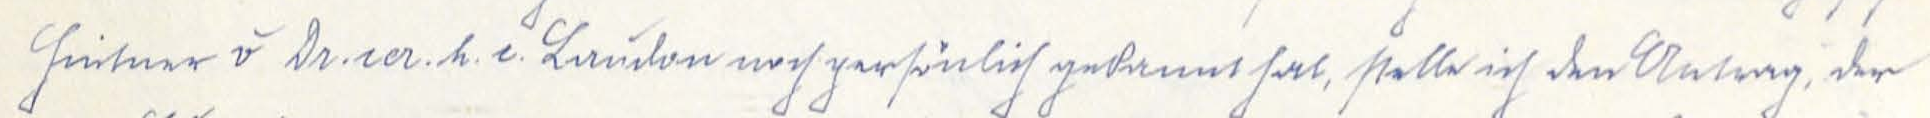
Hintner v/o Dr. cer. h. c. Laudon noch persönlich gekannt hat, stelle ich den Antrag, der
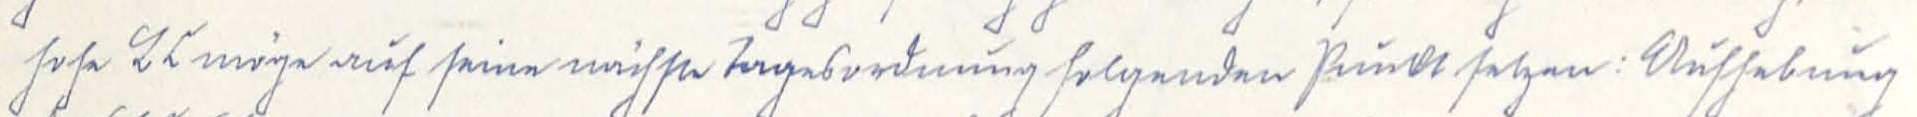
hohe BC möge auf seine nächste Tafesordnung folgenden Punkt setzen: Aufhebung
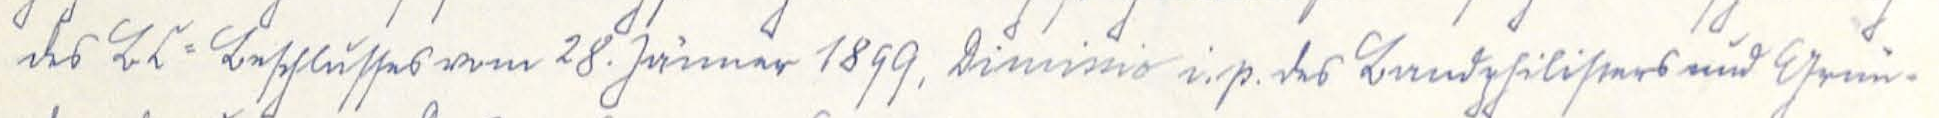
des BC-Beschlusses vom 28. Jänner 1899, Dimissio i. p. des Bandphilisters und Grün-
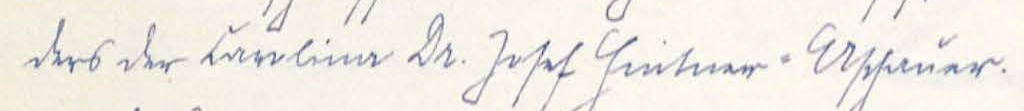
ders der Carolina Dr. Josef Hintner-Aschauer.
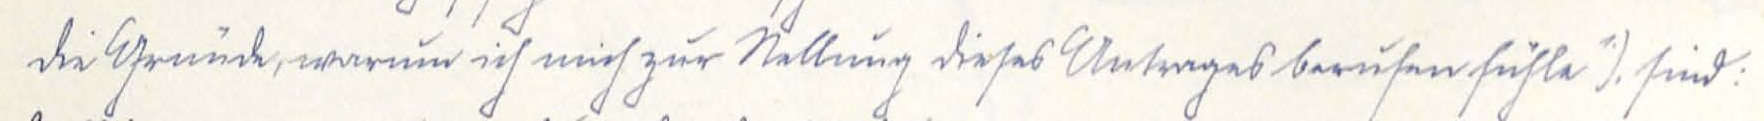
Die Gründe, warum ich mich zur Stellung dieses Antrages berufen fühle 1.) sind:
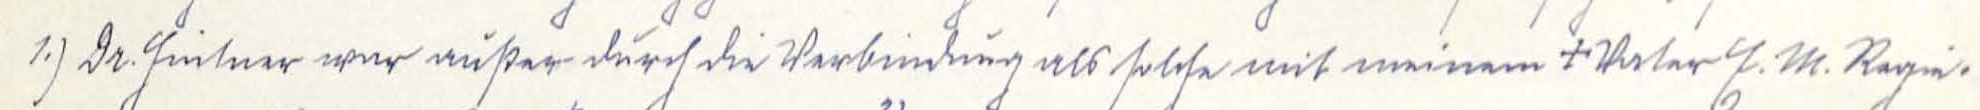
1.) Dr. Hintner war außer durch die Verbindung als solche mit meinem Vater E. M. Regie-
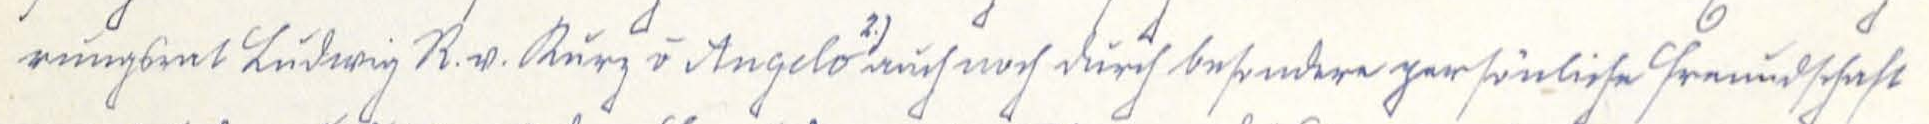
rungsrat Ludwig R. v. Kurz v/o Angelo 2.) auch noch durch besondere persönliche Freundschaft
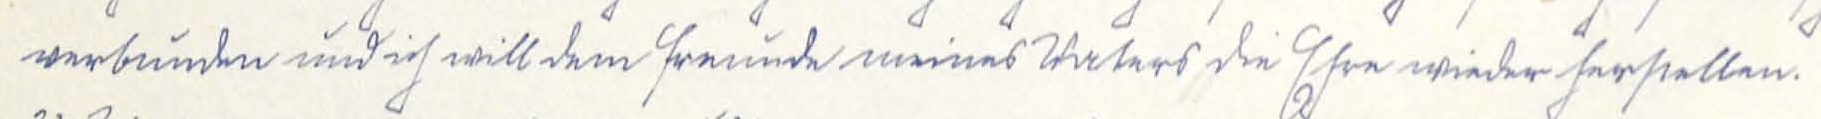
verbunden und ich will dem Freunde meines Vaters die Ehre wieder herstellen.
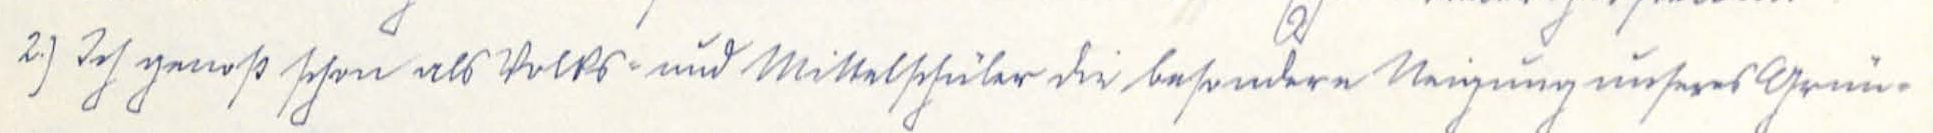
2.) Ich genoß schon als Volks- und Mitteschüler die besondere Neigung unseres Grün-
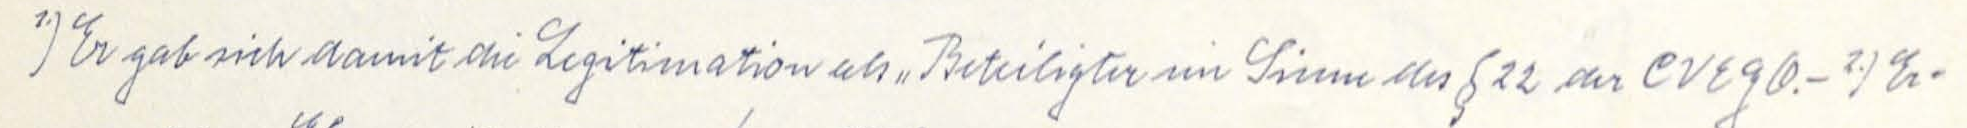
1.) Er gab sich damit die Legitimation als "Beteiligter" im Sinne des §22 der CVEGO.- 2.) Er-
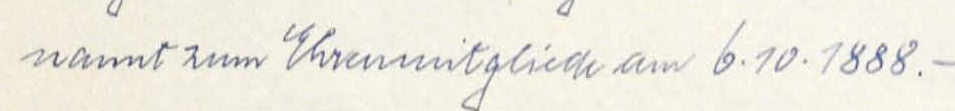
nannt zum Ehrenmitglied am 6. 10. 1888.-
